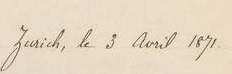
Zurich, le 3 Avril 1871.
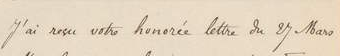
J'ai reçu votre honorée lettre du 27 Mars
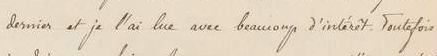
dernier et je l'ai lue avec beaucoup d'intérêt. Toutefois
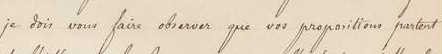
je dois vous faire observer que vos propositions partent
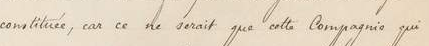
constituée, car ce ne serait que cette Compagnie qui
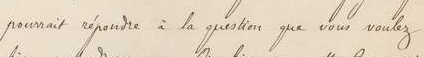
pourrait répondre à la question que vous voulez
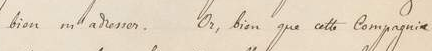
bien m'adresser. Or, bien que cette Compagnie
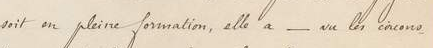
soit en pleine formation, elle a – vu les circons-
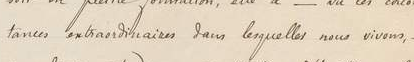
tances extraordinaires dans lesquelles nous vivons, –
